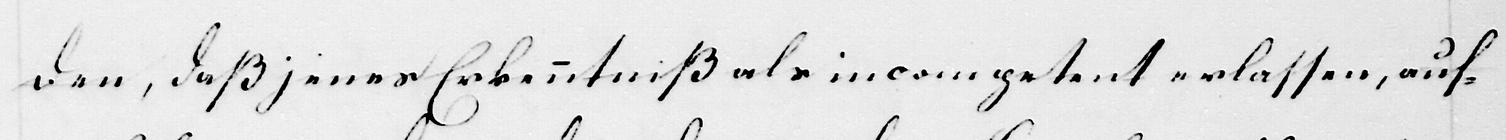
den, daß jenes Erkenntniß als incompetent erlassen, auf¬
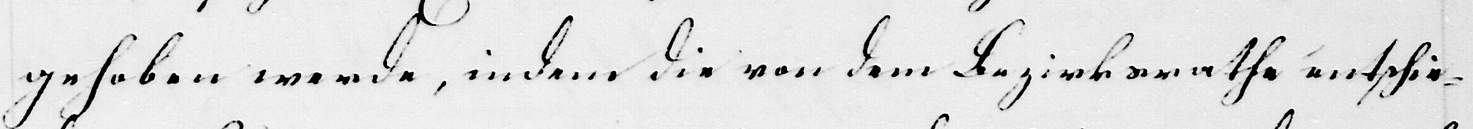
gehoben werde, indem die von dem Bezirksrathe entschie¬
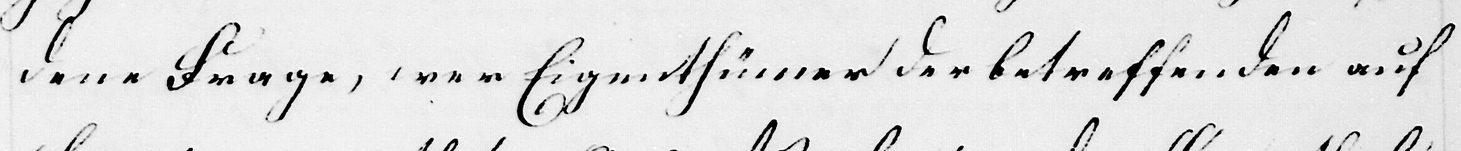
dene Frage, wer Eigenthümer der betreffenden auf
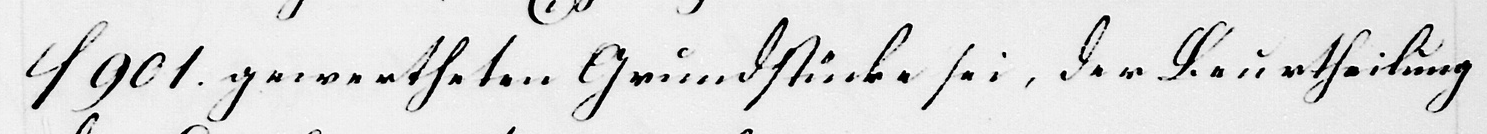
f 901. gewertheten Grundstücke sei, der Beurtheilung
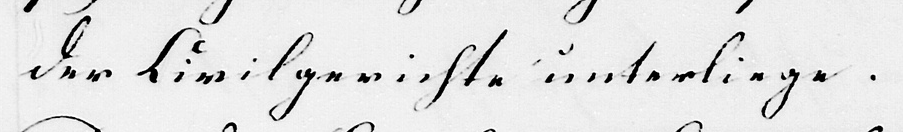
der Civilgerichte unterliege.
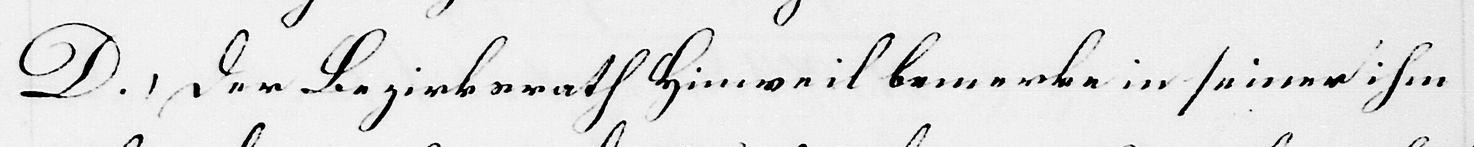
D., Der Bezirksrath Hinweil bemerke in seiner ihm
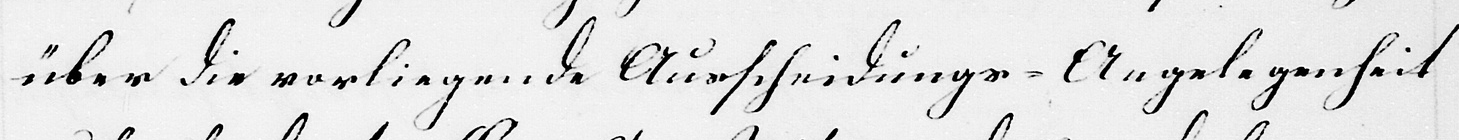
über die vorliegende Ausscheidungs-Angelegenheit
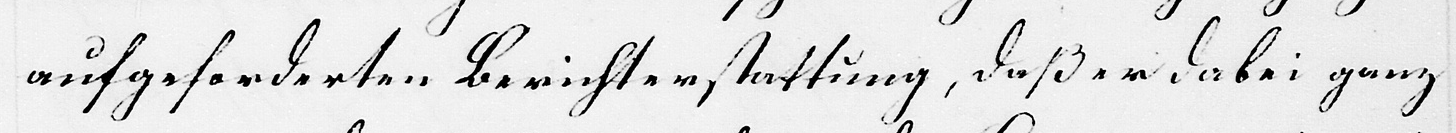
aufgeforderten Berichterstattung, daß er dabei ganz
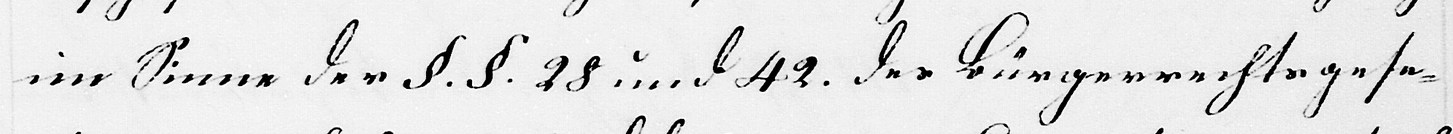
im Sinne der §. §. 28 und 42. des Bürgerrechtsgese¬
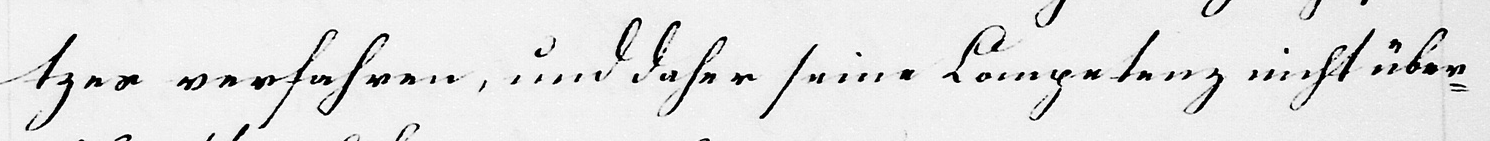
tzes verfahren, und daher seine Competenz nicht über¬
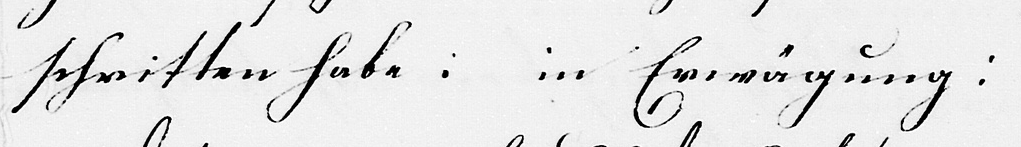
schritten habe. in Erwägung:
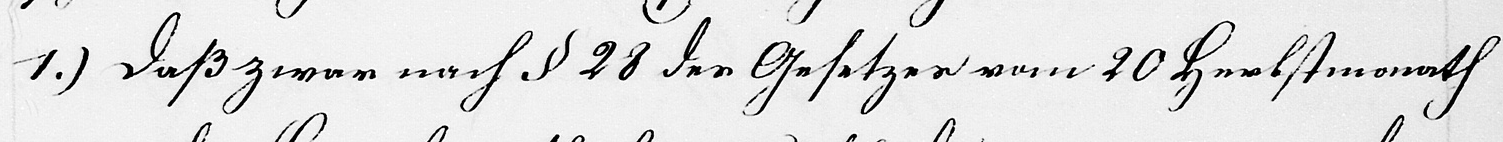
1.) Daß zwar nach § 28 des Gesetzes vom 20 Herbstmonat¬
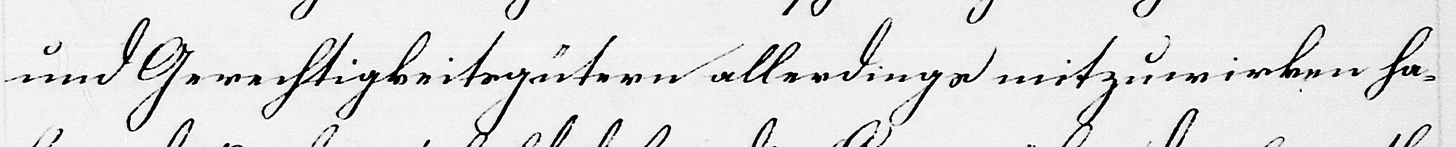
und Gerechtigkeitsgütern allerdings mitzuwirken ha¬
